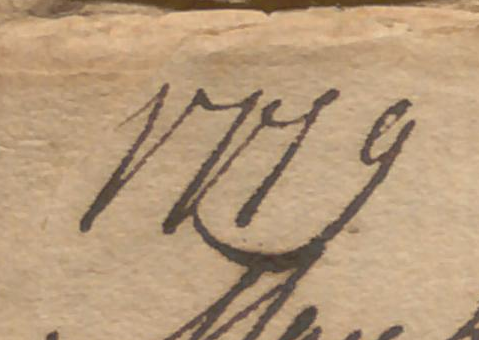177
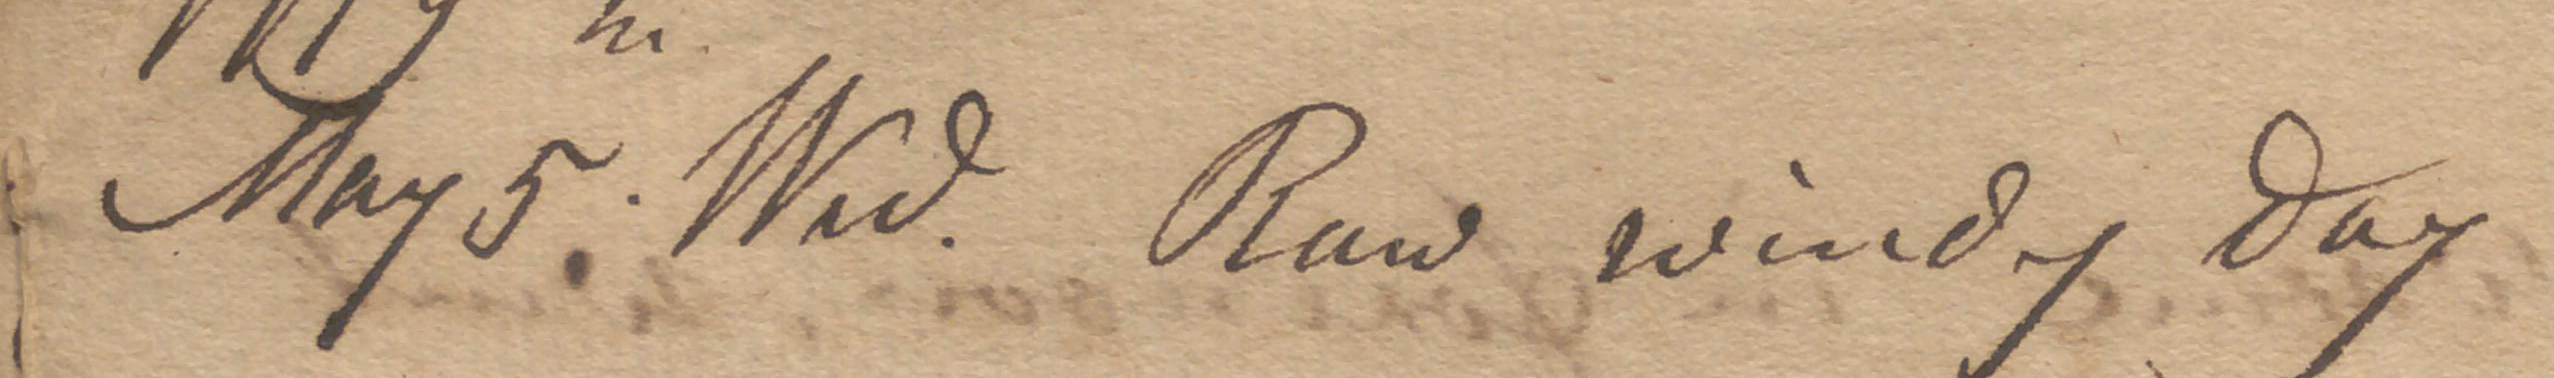May 5^th. Wed. Raw windy day
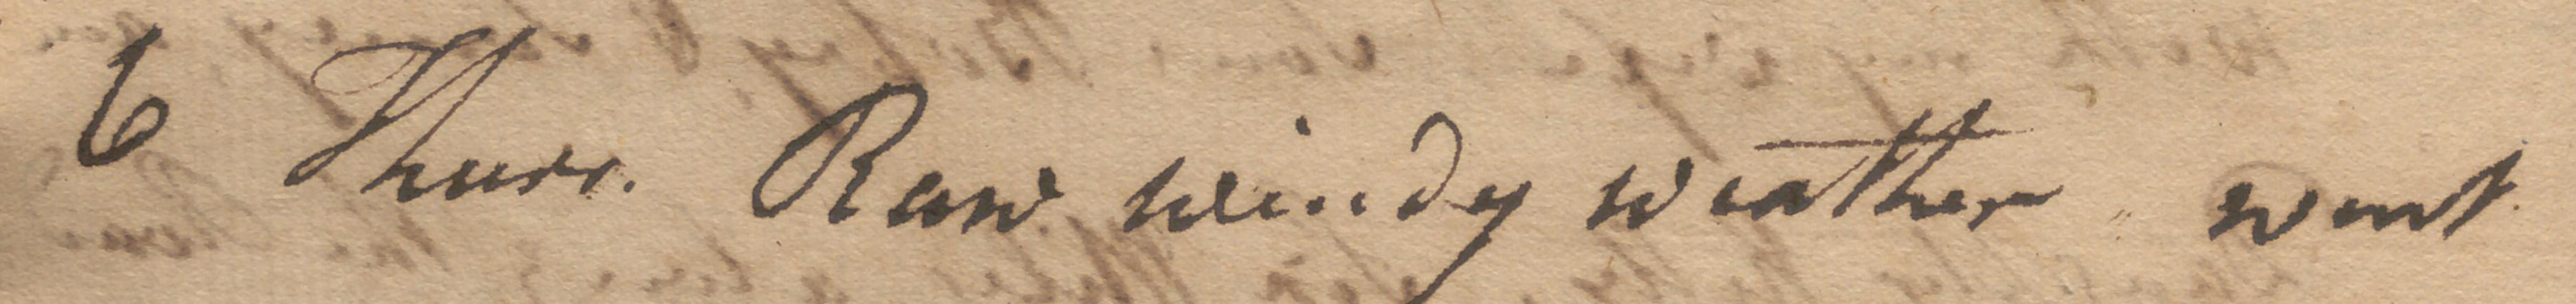6 Thurs Raw windy weather went
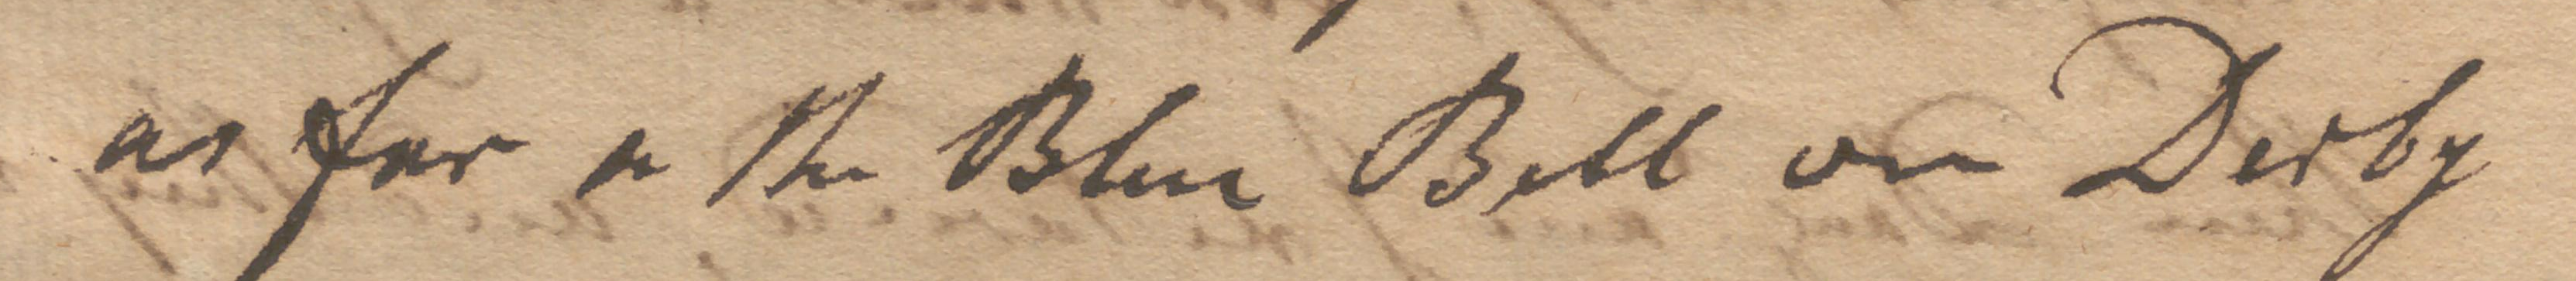as far a the Blue Bell on Derby
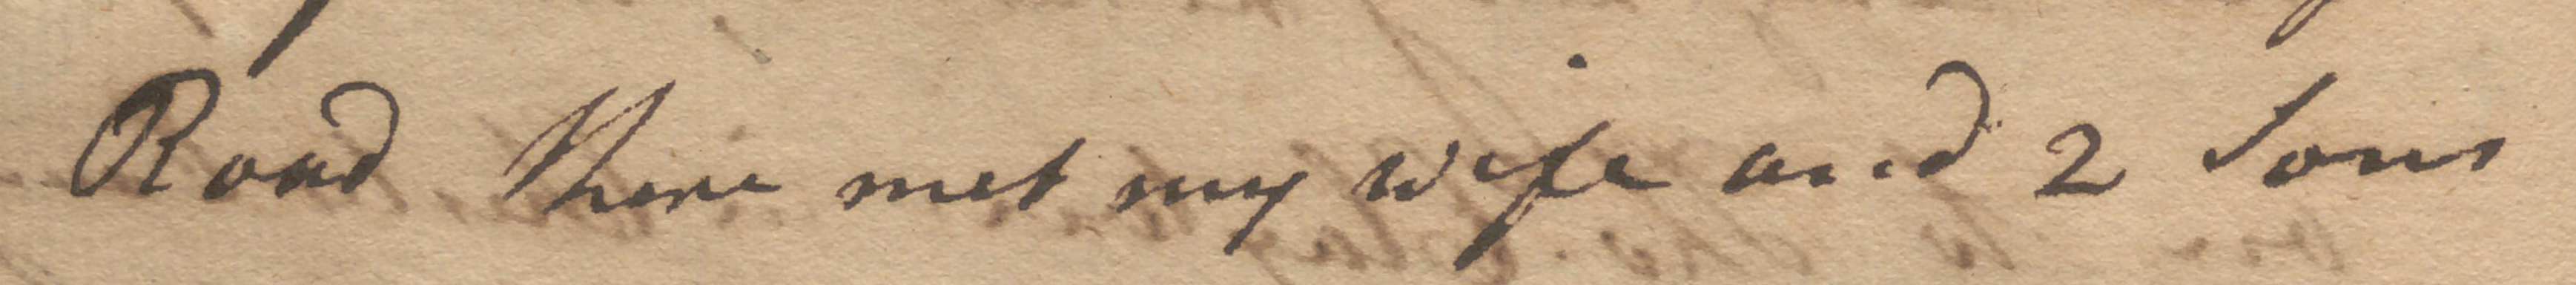Road there met my wife and 2 sons
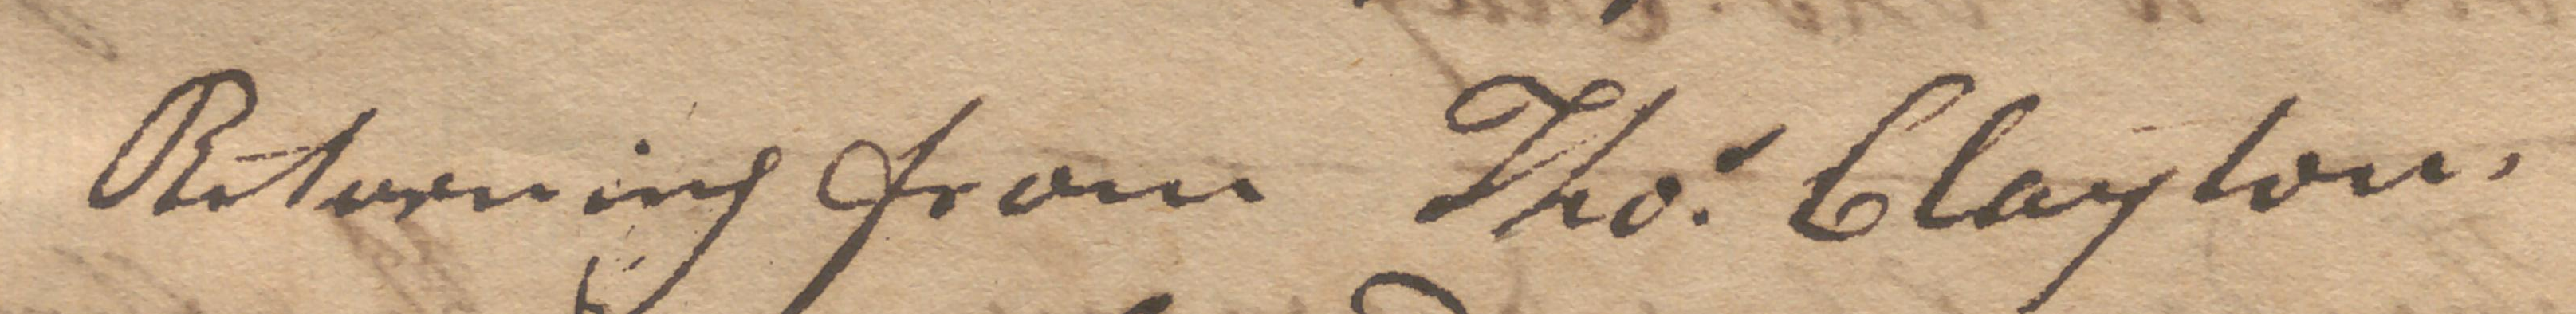Returning from Tho^s. Claytons
